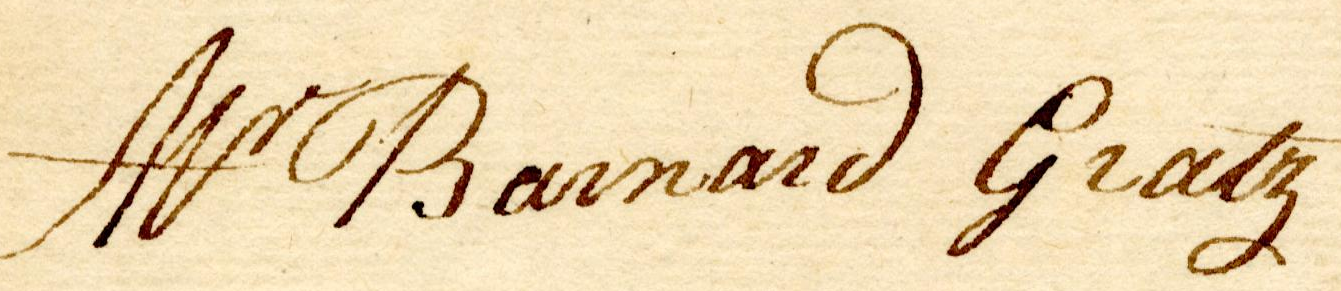M^r Barnard Gratz
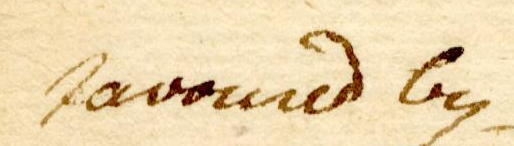favoured by
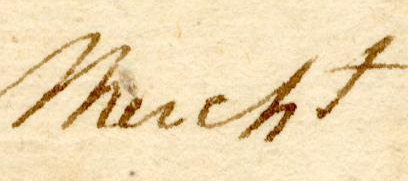Merch^t
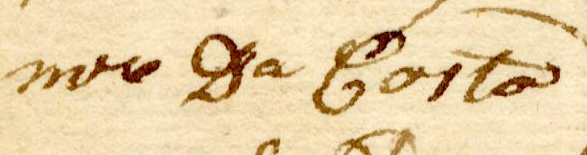M^r da Costo
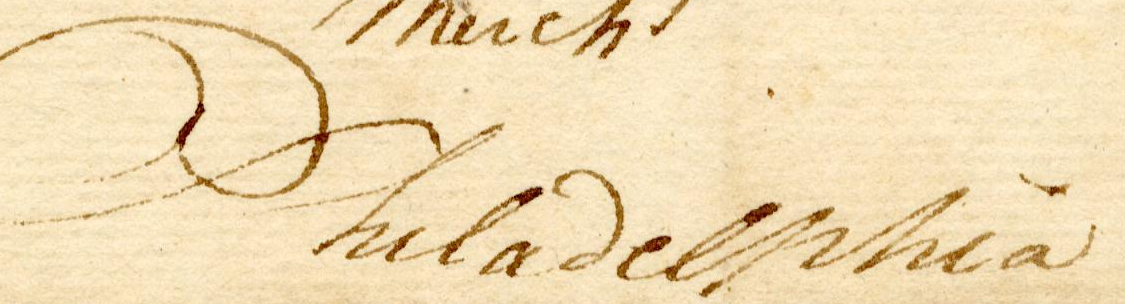Philadelphia
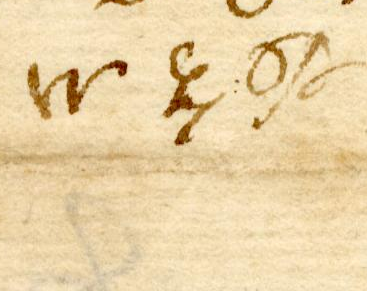W & P
